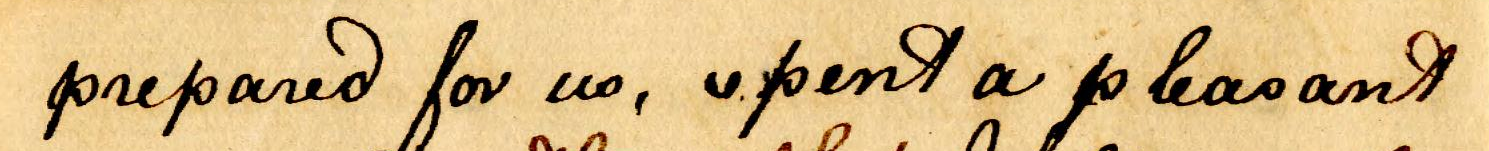prepared for us, spent a pleasant
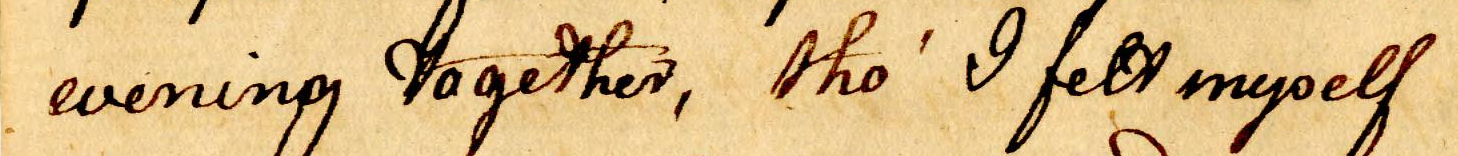evening together, tho' I felt myself
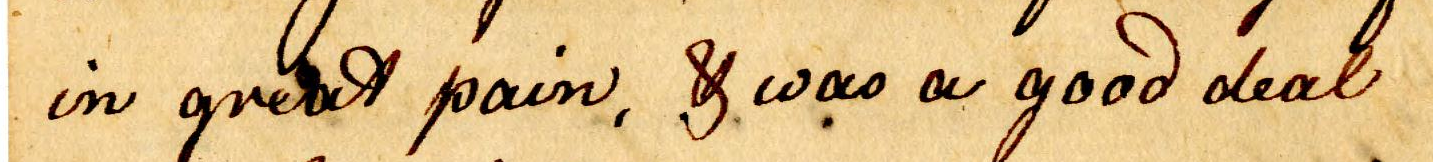in great pain, & was a good deal
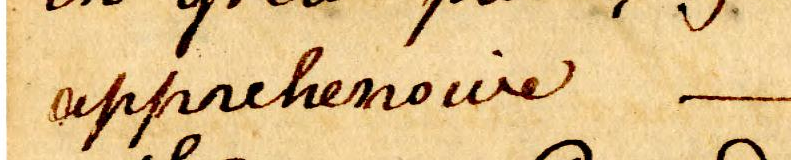apprehensive-
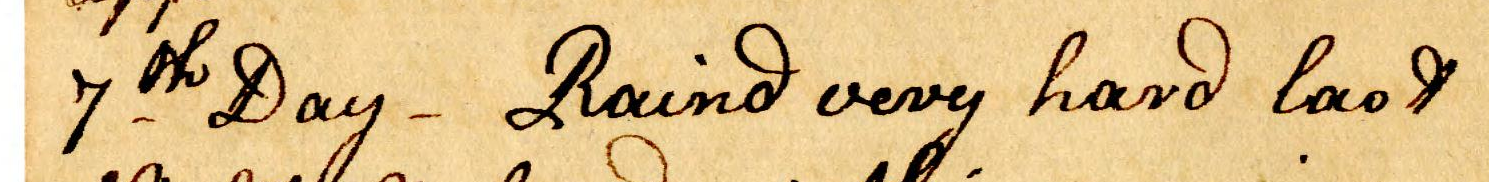7^th Day- Raind very hard last
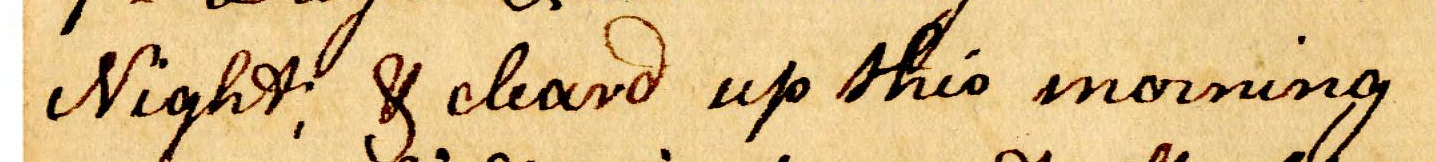Night, & cleard up this morning
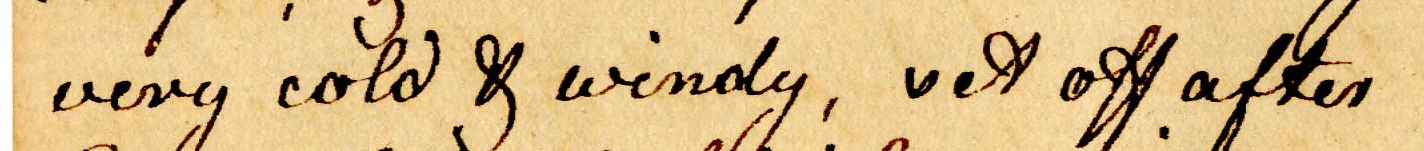very cold & windy, set off after
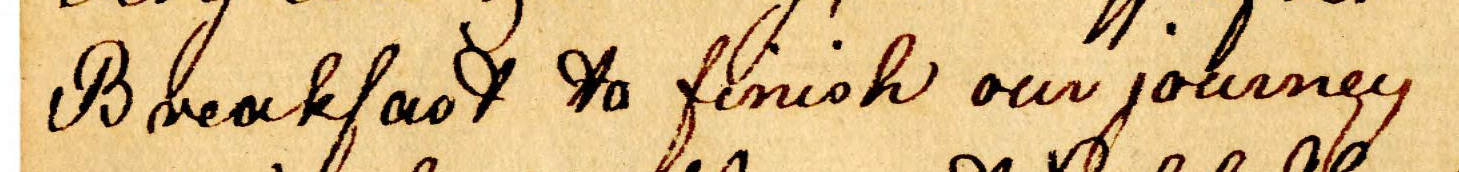Breakfast to finish our journey
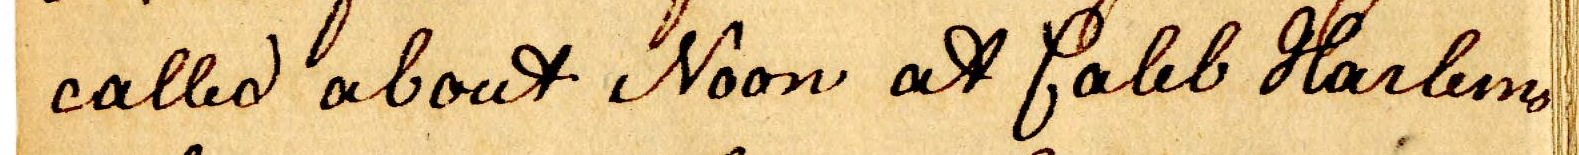called about Noon at Caleb Harlems
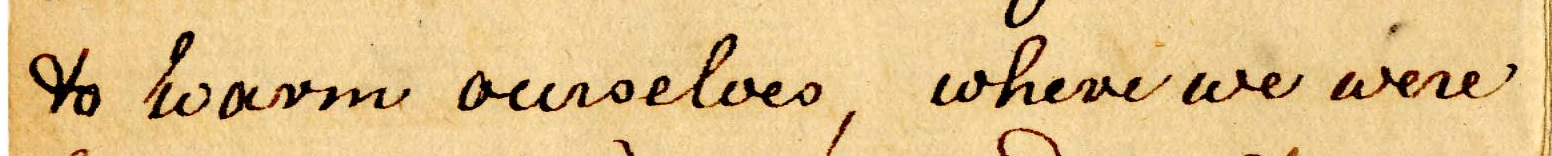to warm ourselves, where we were
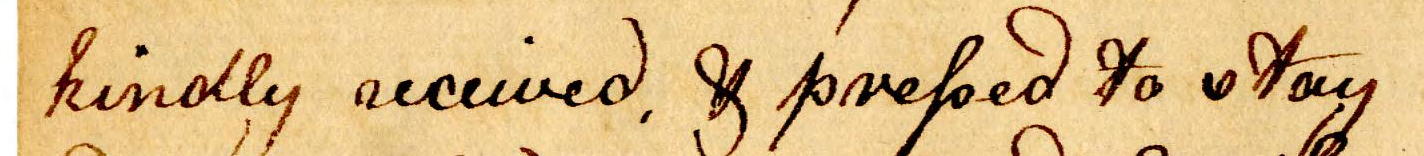kindly received, & pressed to stay
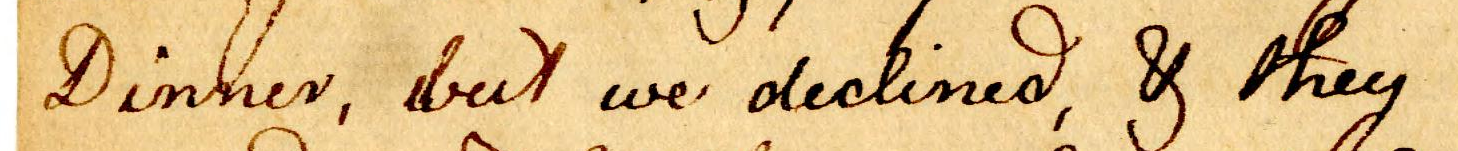Dinner, but we declined, & they
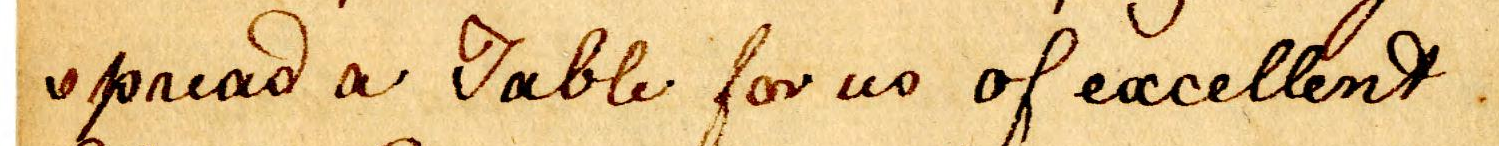spread a Table for us of excellent
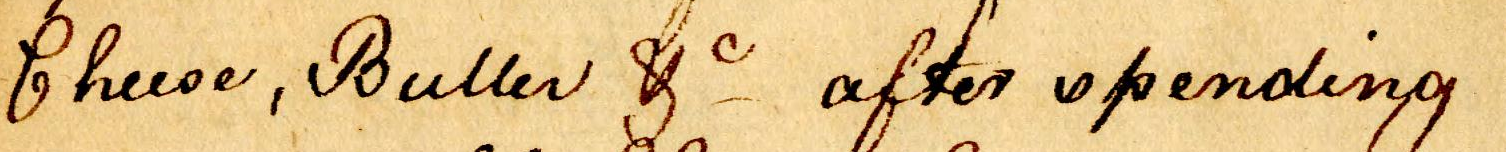Cheese, Butter &^c after spending
